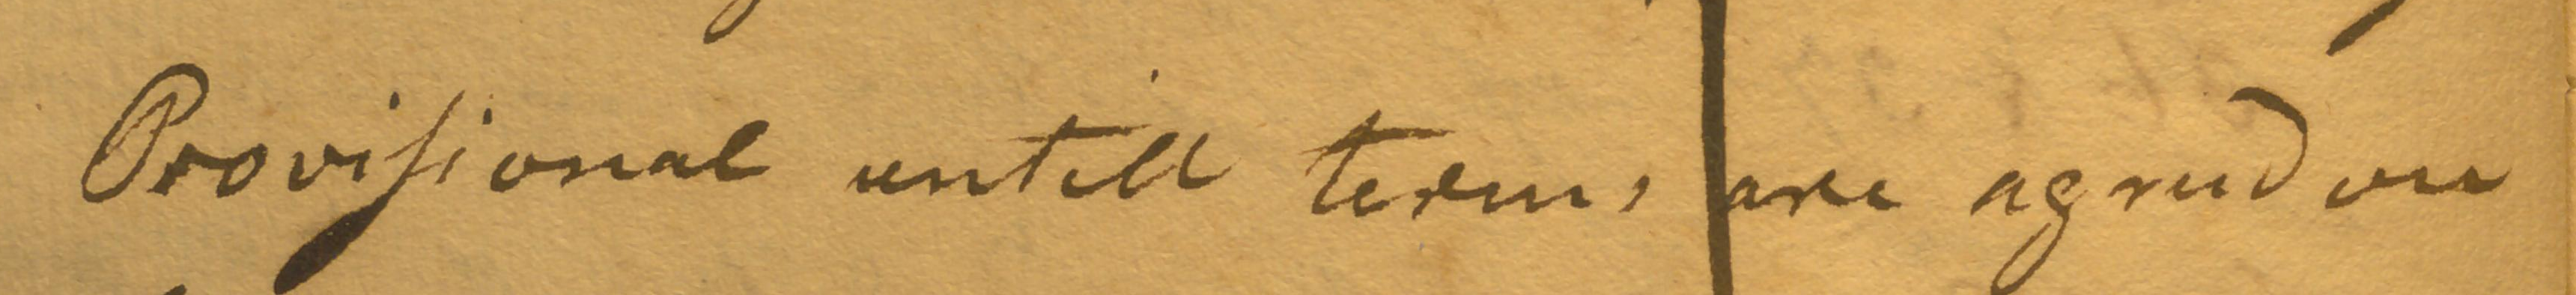Provisional untill terms are agreed on
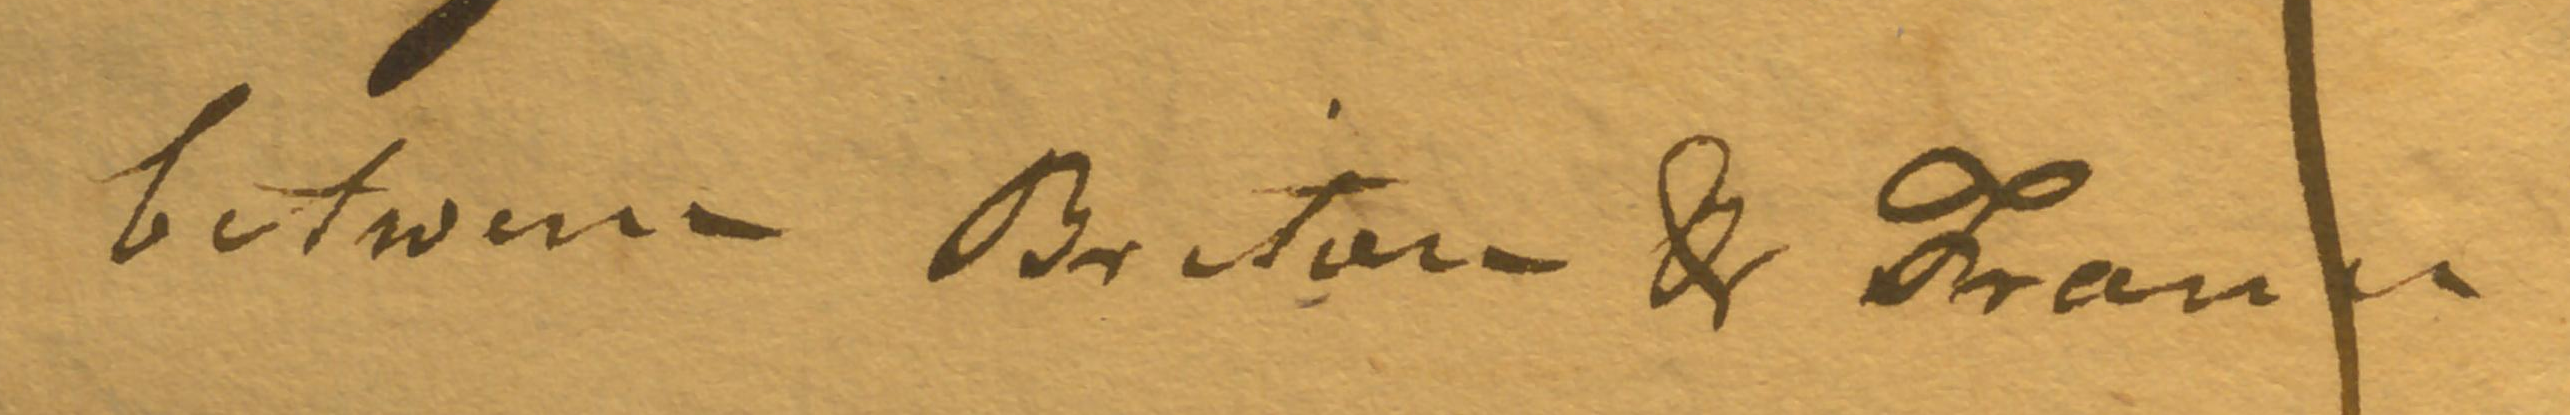betwene Briton & France
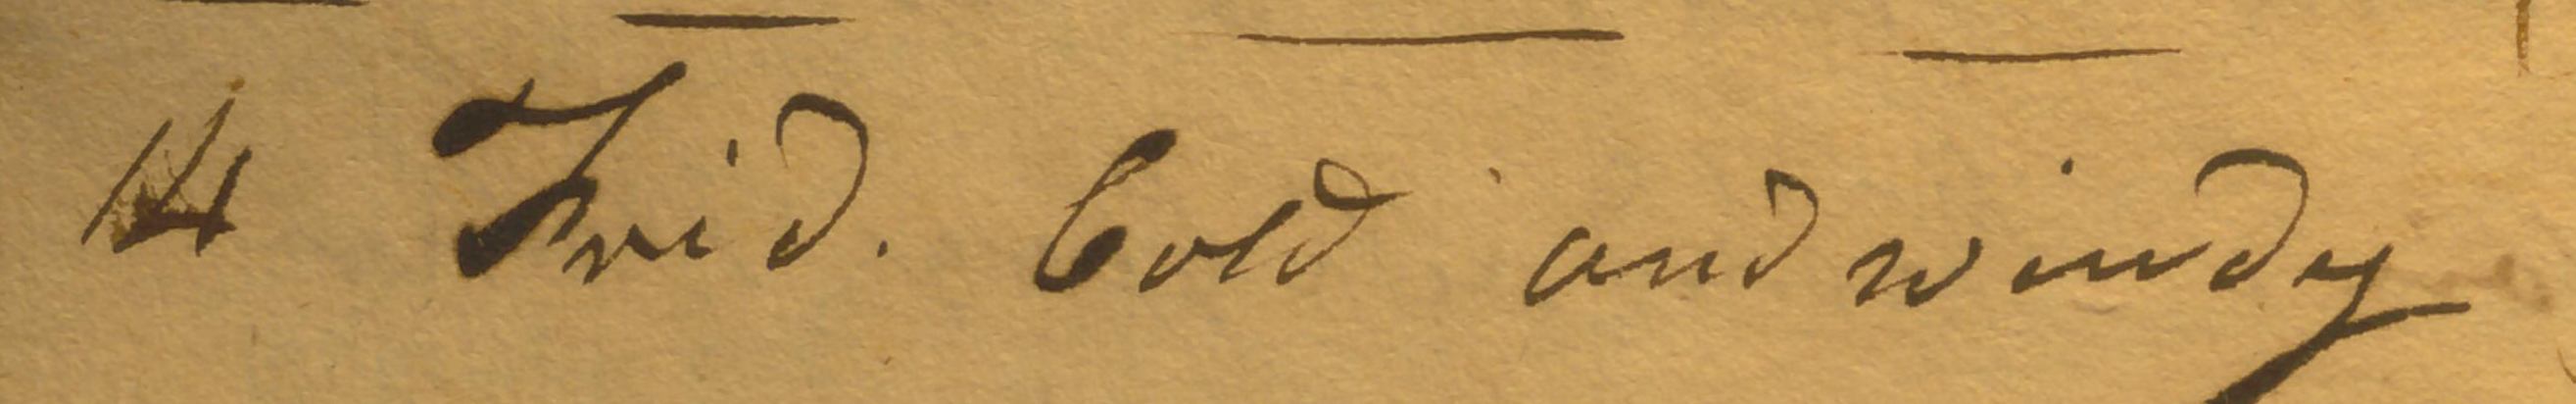14 Frid. Cold and windy
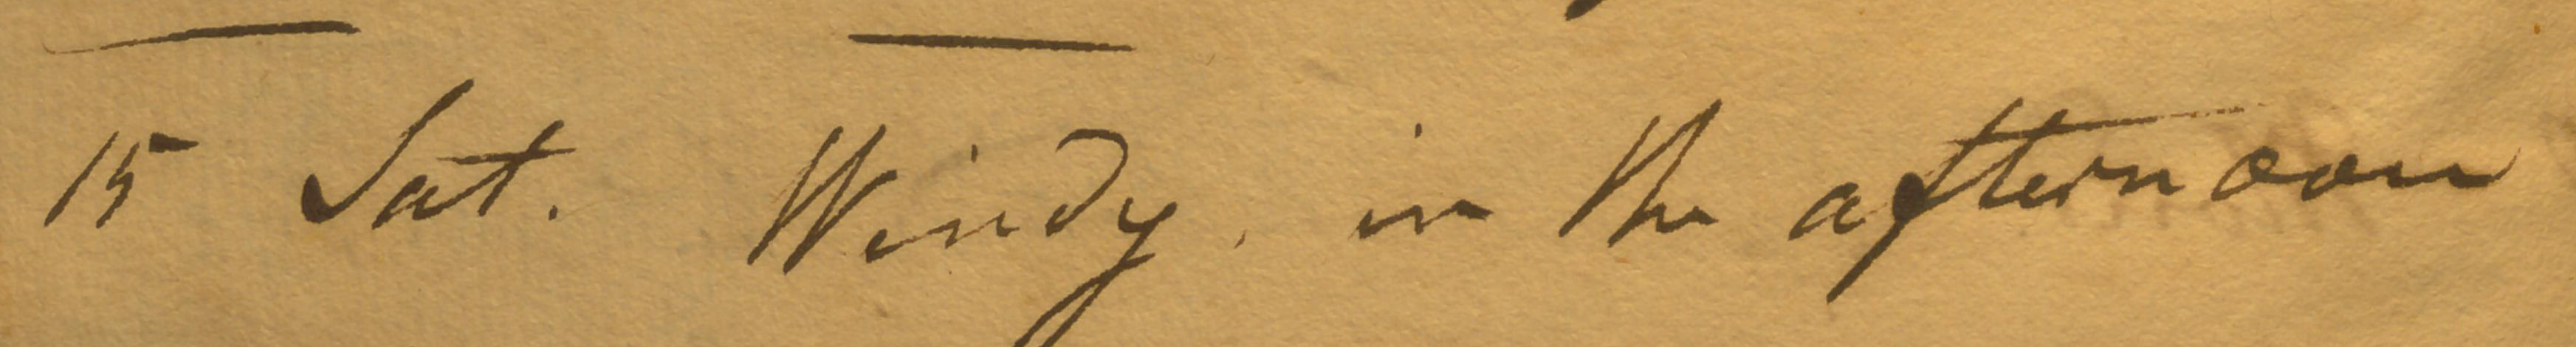15 Sat. Windy, in the afternoon
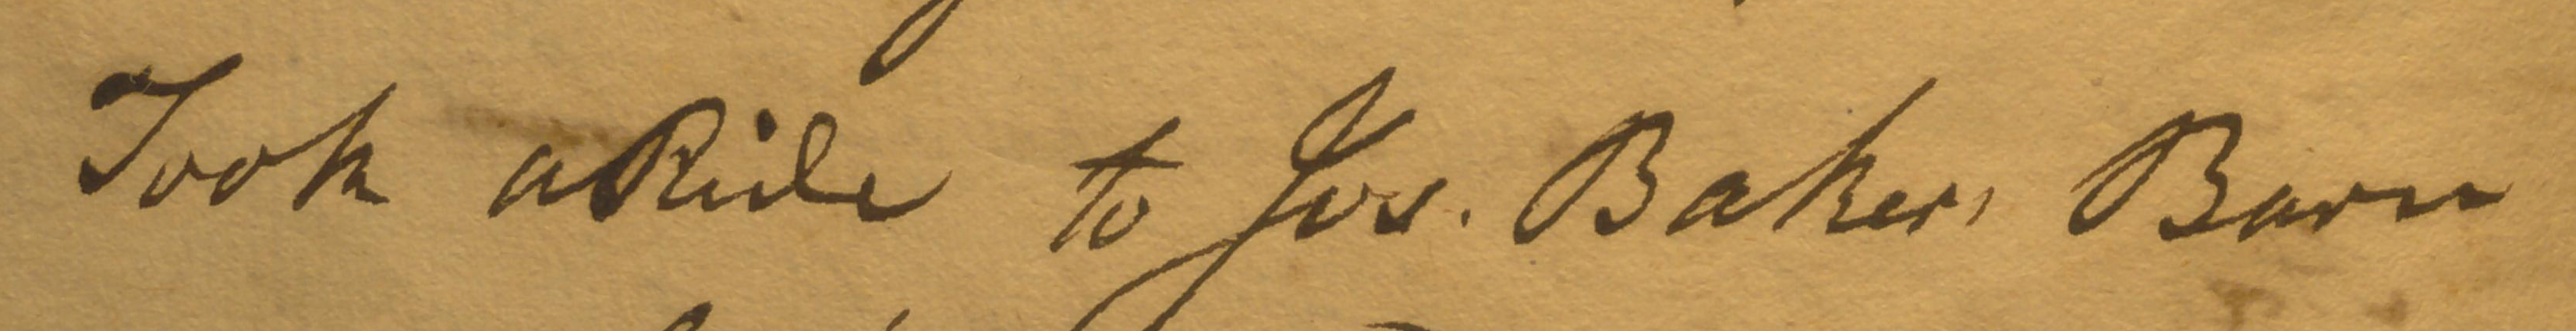Took a Ride to Jos. Bakers Barn
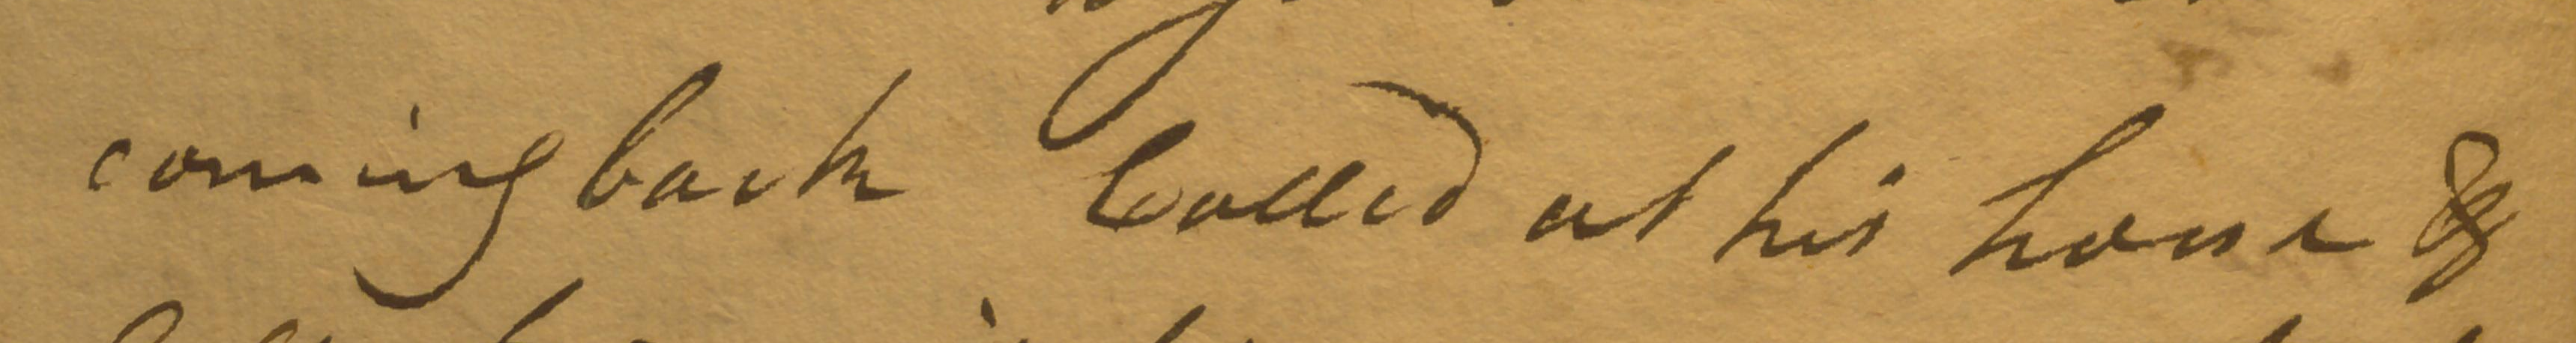coming back Called at his house &
